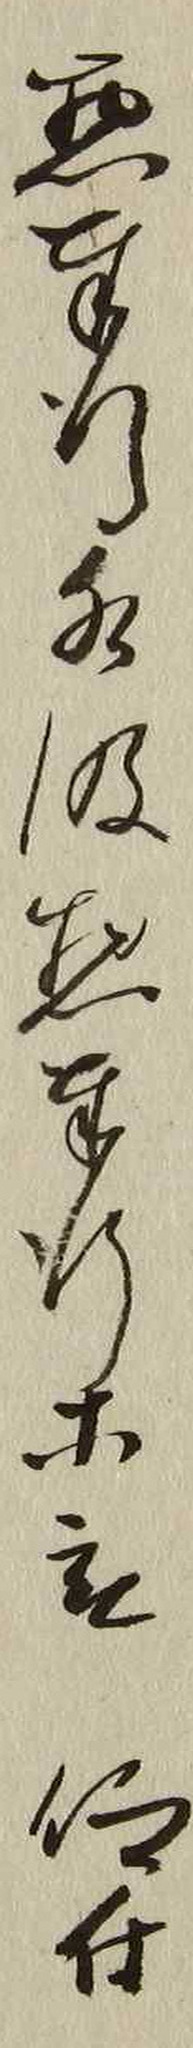惣奉行水汲惣奉行等被仰付
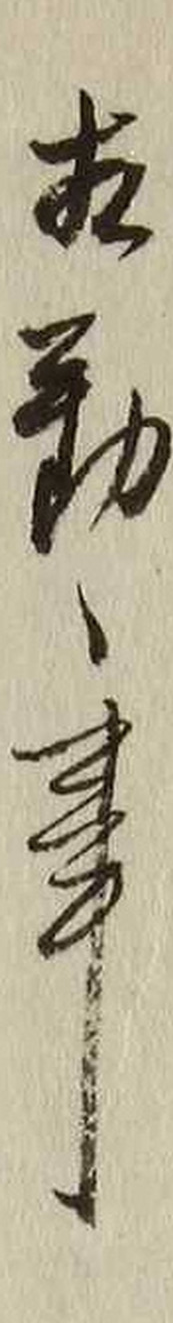相勤候事
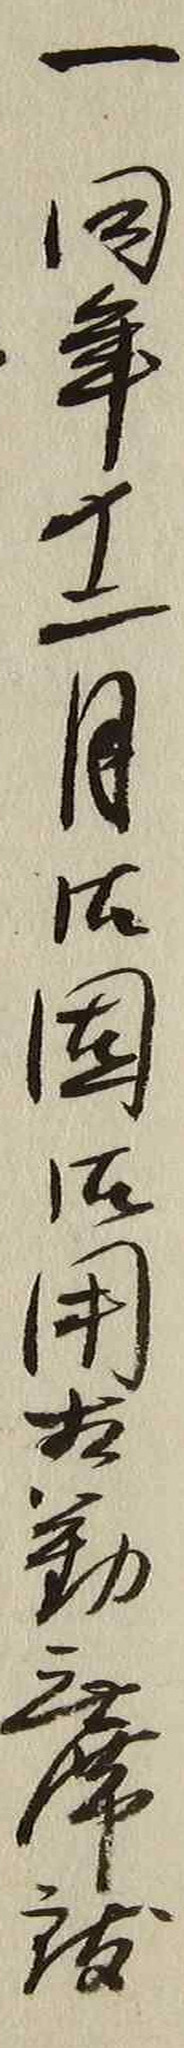一同年十二月御国御用相勤無滞致
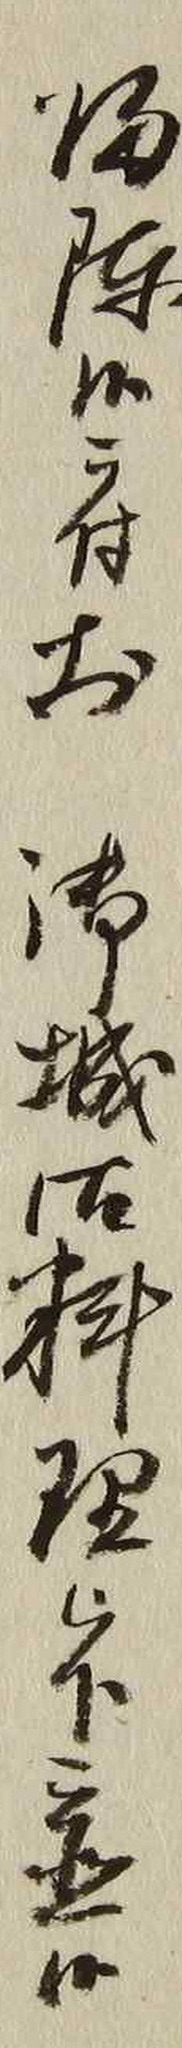帰陣候ニ付於御城御料理被下置候
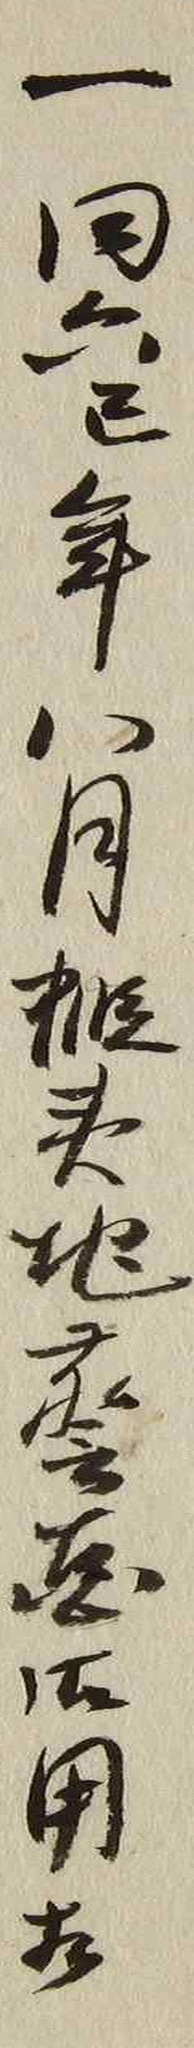一同六巳年八月蝦夷地警固御用相
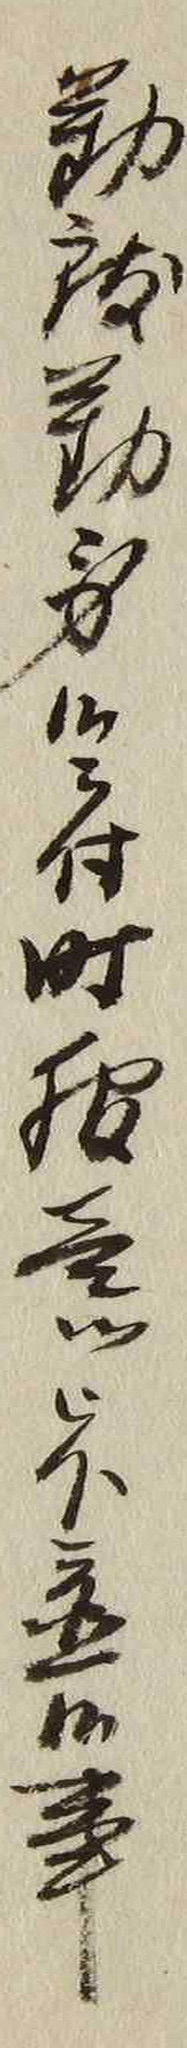勤致勤労候ニ付時服壱ツ被下置候事
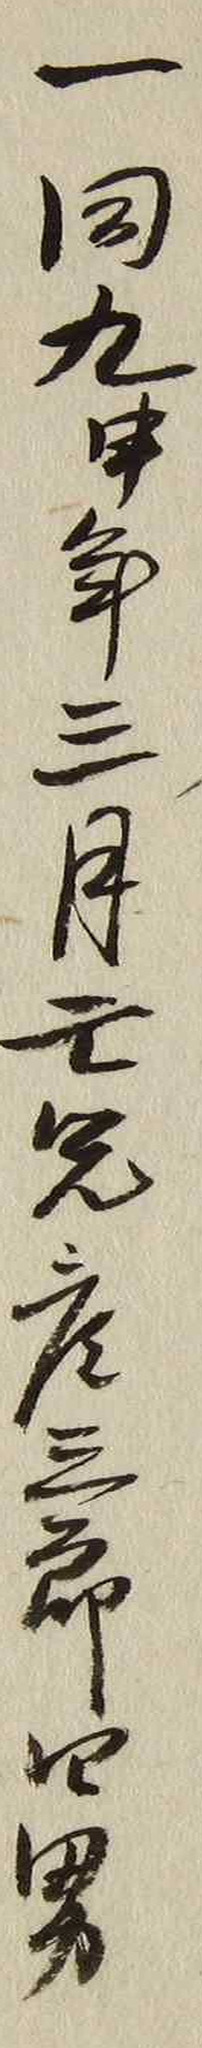一同九申年三月亡兄彦三郎四男
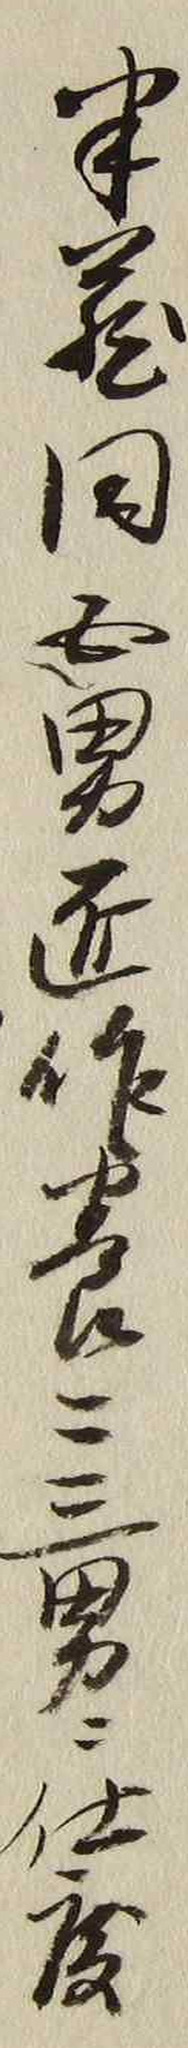半蔵同五男匠作養二三男ニ仕度
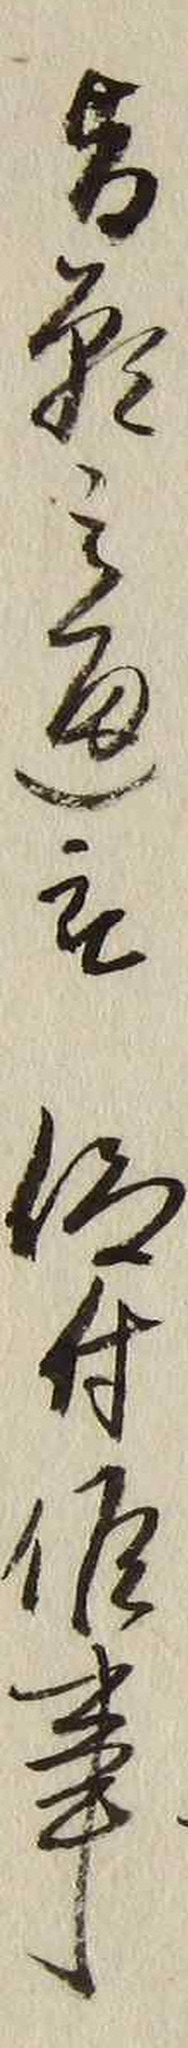旨願之通被仰付候事
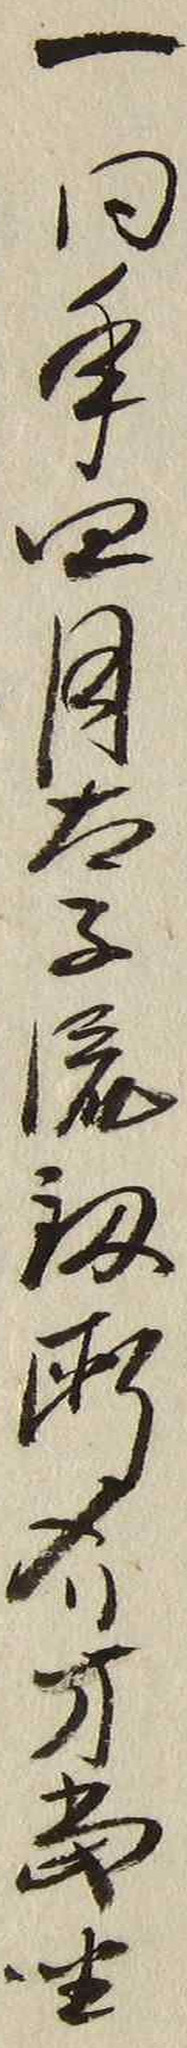一同年四月太子流剣術〆リ方当坐
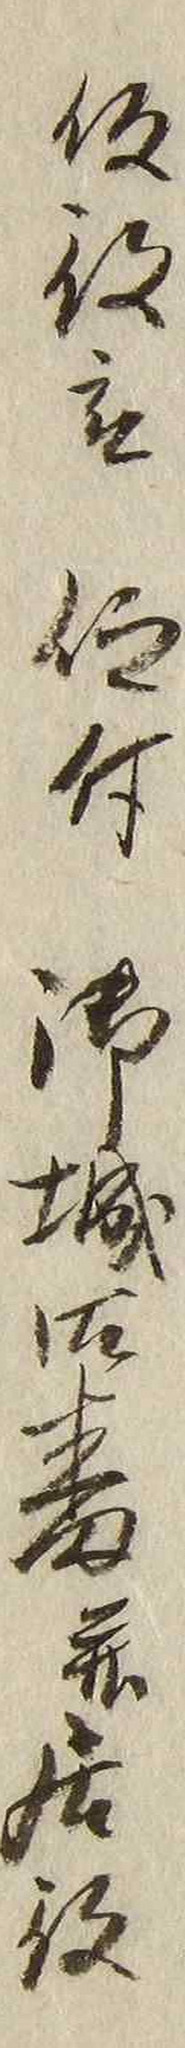仮役被仰付御城御番并居役

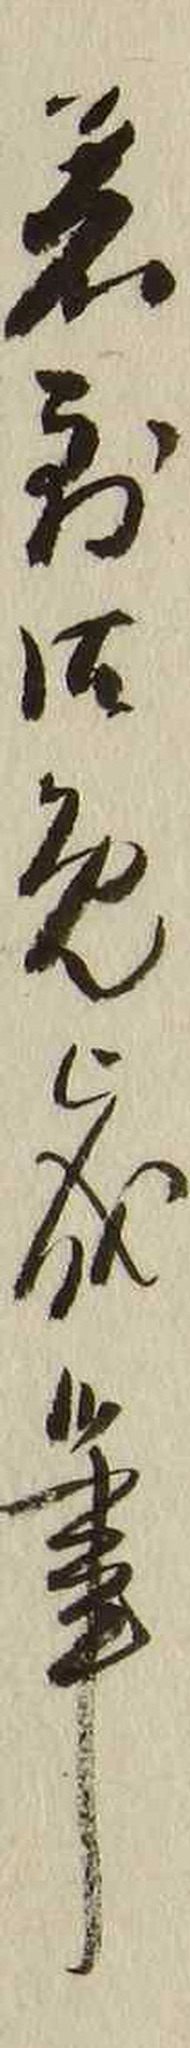着到御免被成候事
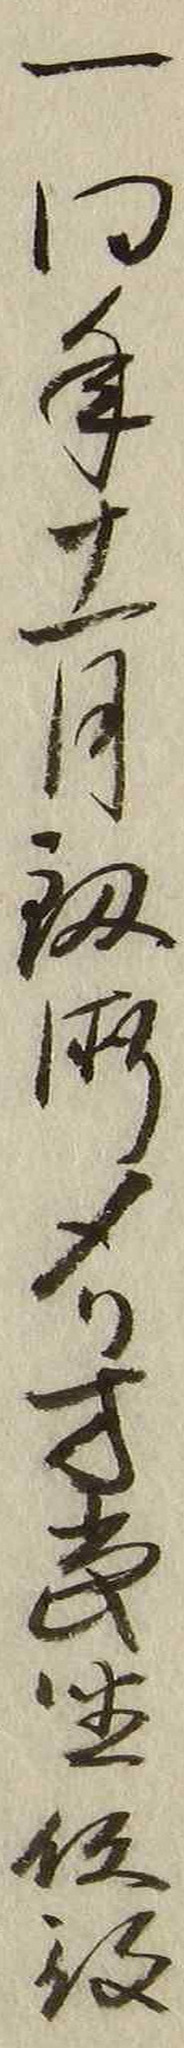一同年十一月剣術〆り方当坐仮役
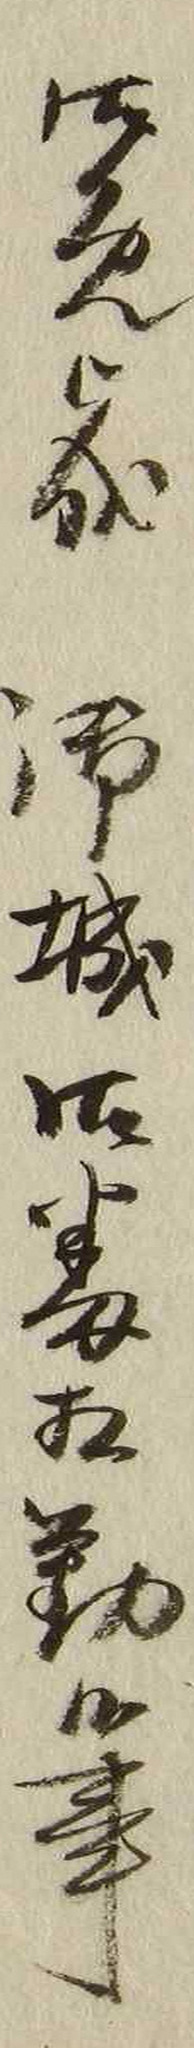御免被成御城御番相勤候事
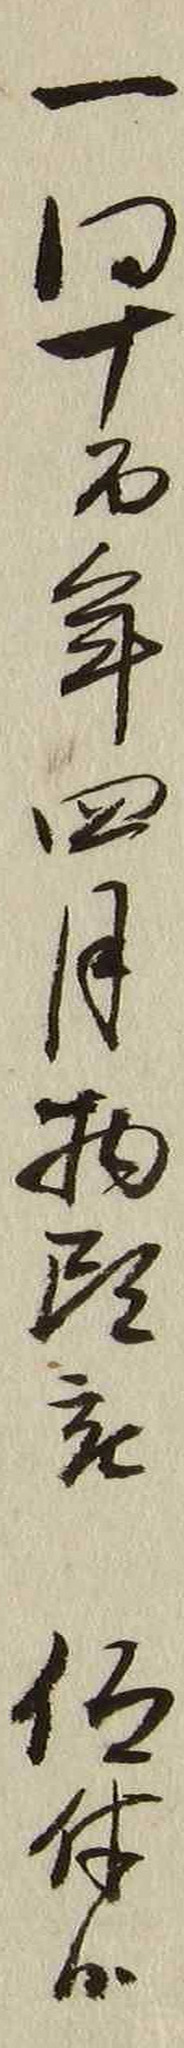一同十酉年四月物頭被仰付候
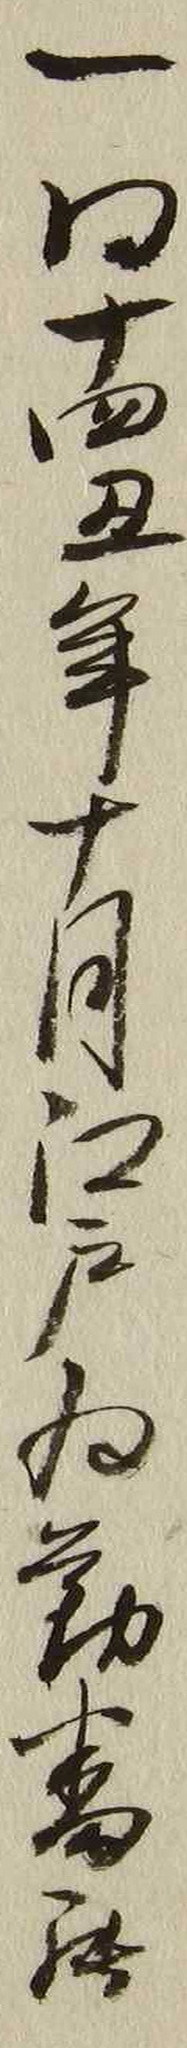一同十四丑年十月江戸為勤番罷
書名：諸士系譜　巻之356　す之部6
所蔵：会津若松市立会津図書館
